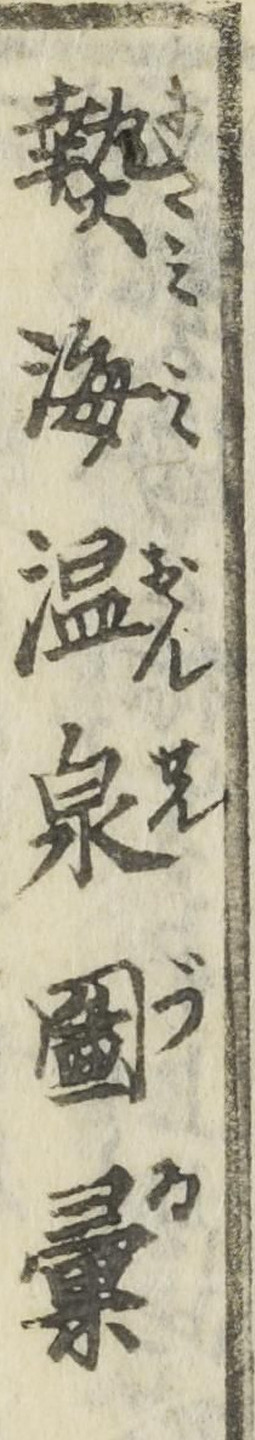熱海温泉圖彙
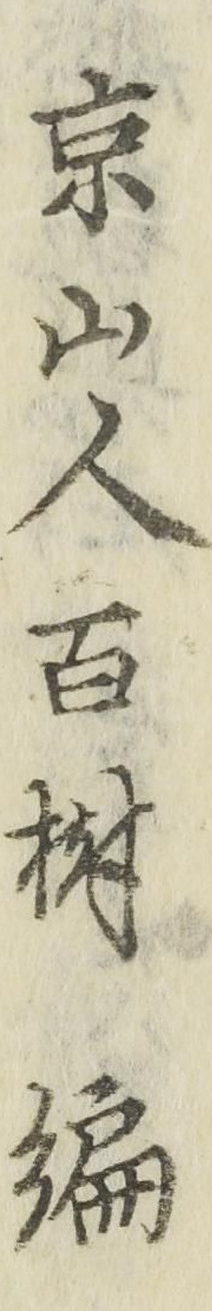京山人百樹識
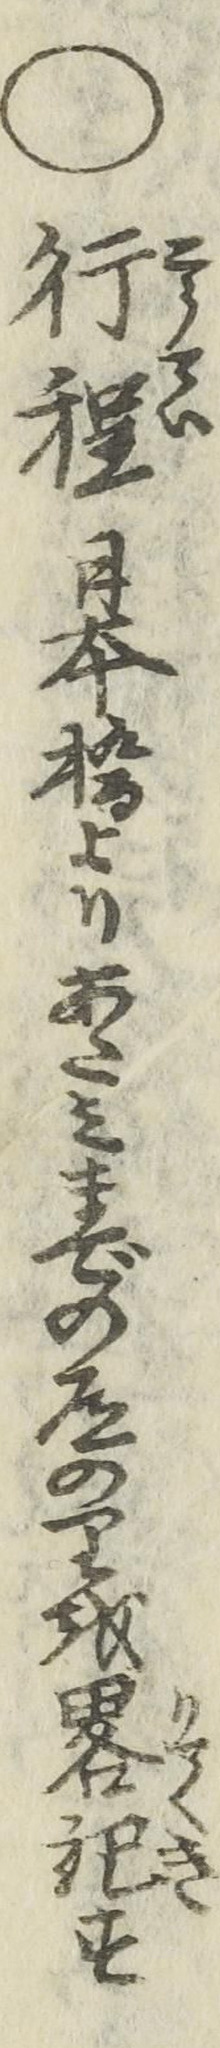〇行程日本橋よりあたみまでの道のりを略記す
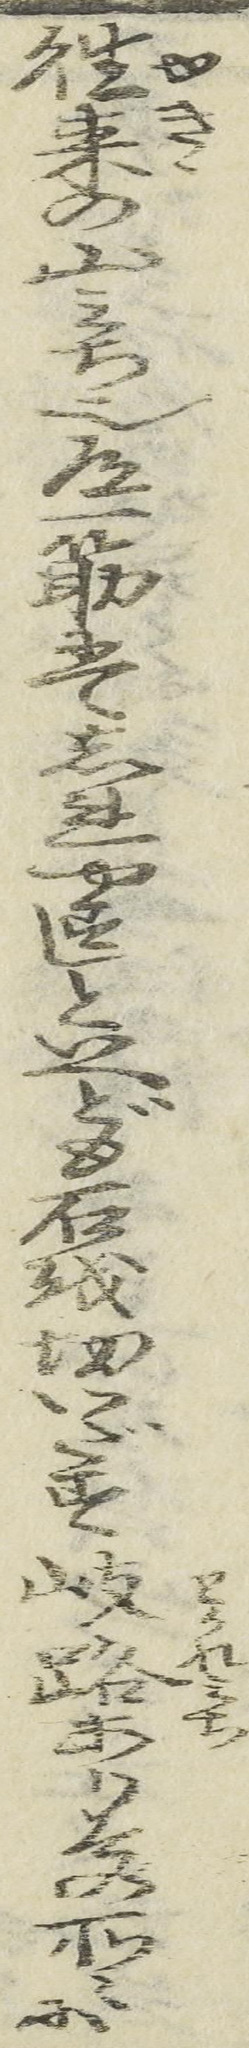往来の山みち也道一筋にてしれやすしといへども石を切いだす岐路ありその所々に
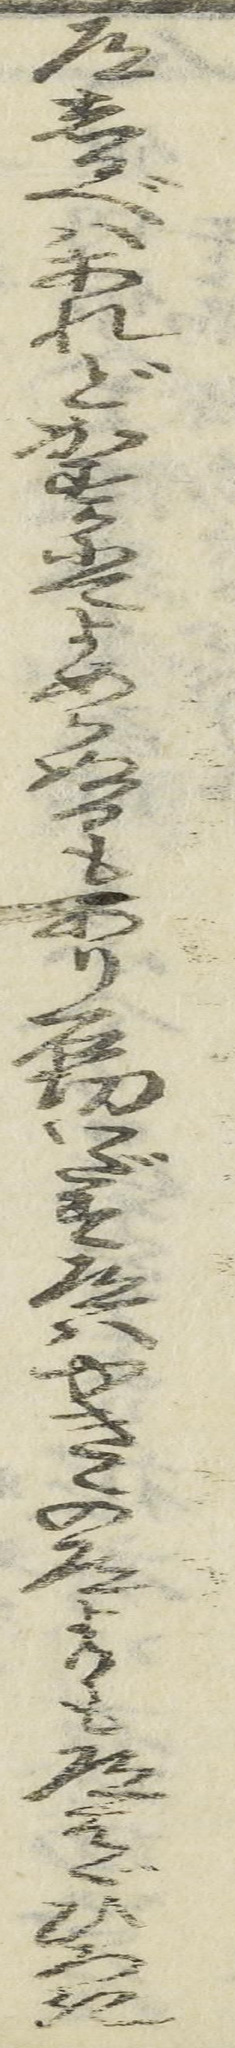道しるべはあれどかすかにてよめさるもあり石切いだす道はゆきゝの道よりも道はゞひろき
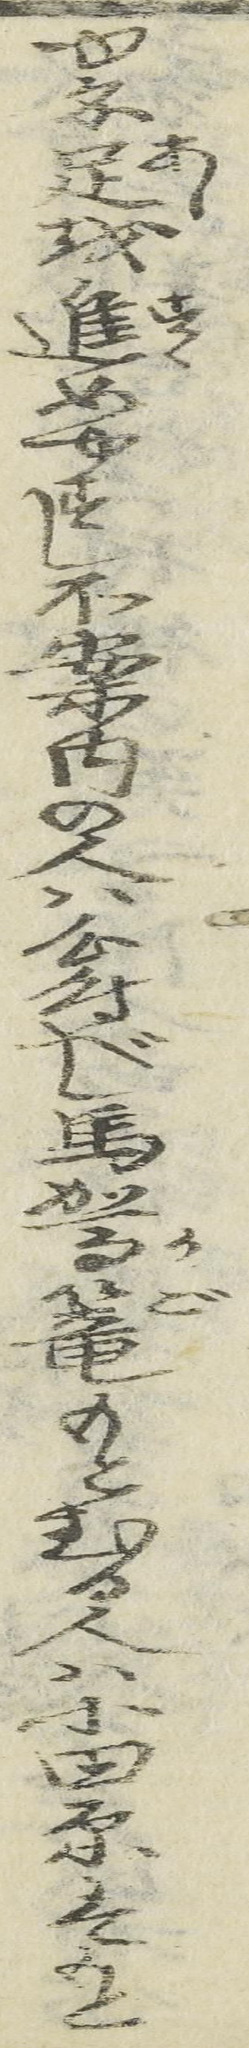ゆえ足を進めやすし不案内の人は心得べし馬駕篭もとむる人は小田原にてもと
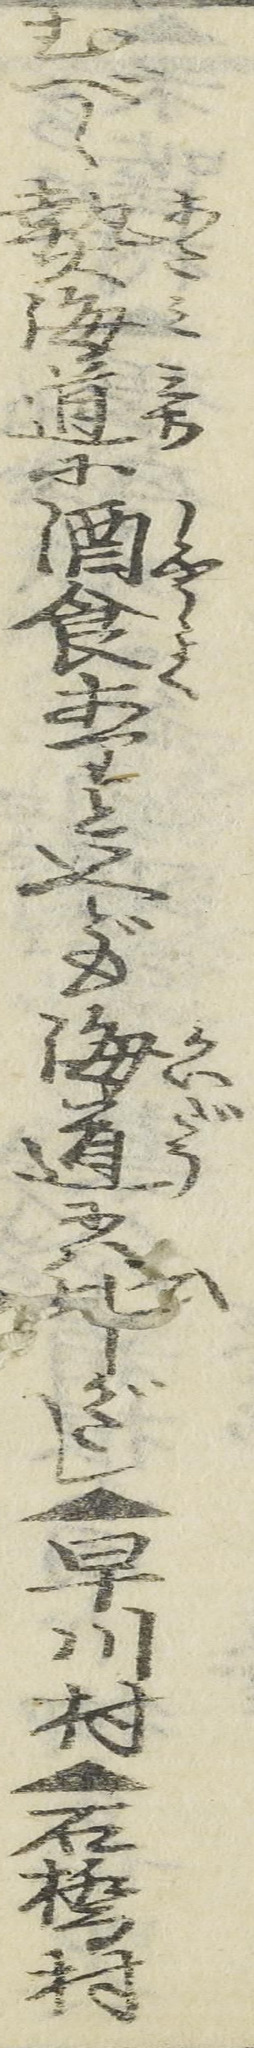むべし熱海道に酒食ありといへども海道には比しがたし▲早川村▲石橋村
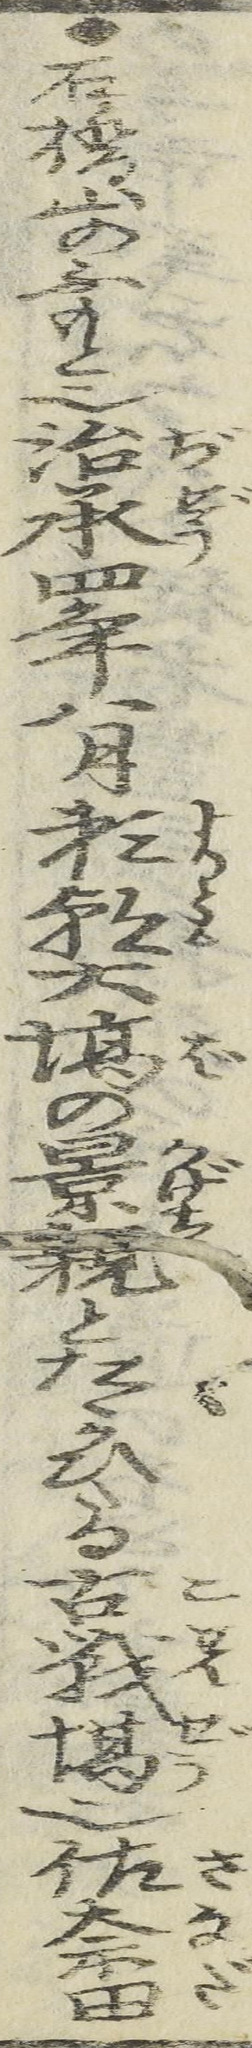●石橋山のふもと也治承四年八月頼朝大場の景親とたゝかひたる古戦場也佐奈田

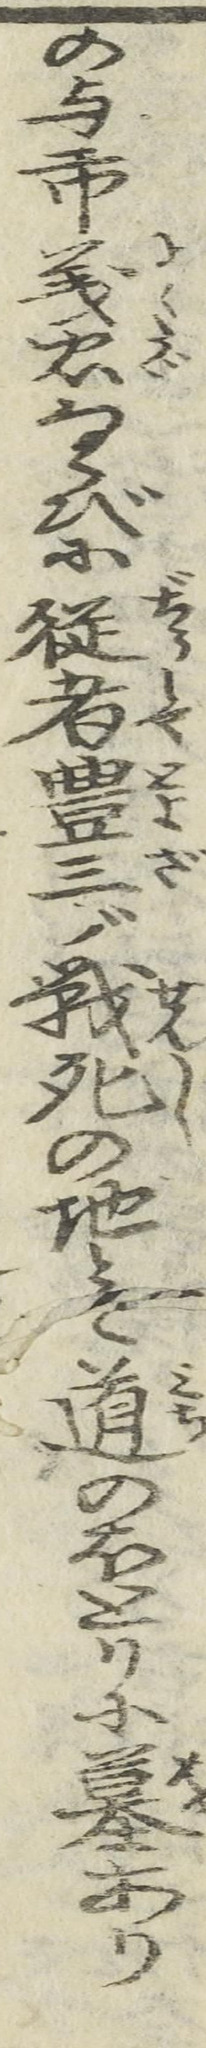の与市義忠ならびに従者豊三ヾの戦死の地とて道のほとりに墓あり
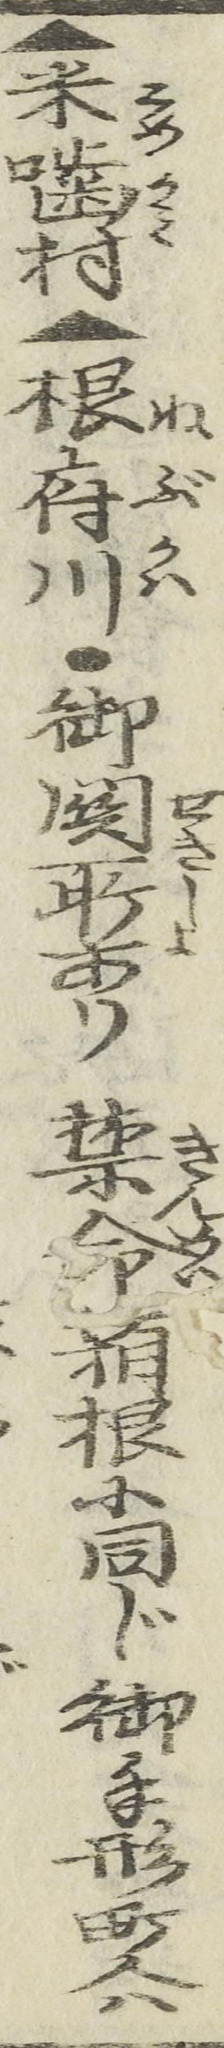▲米噛村▲根府川●御関所あり禁命箱根に同じ御手形町人は
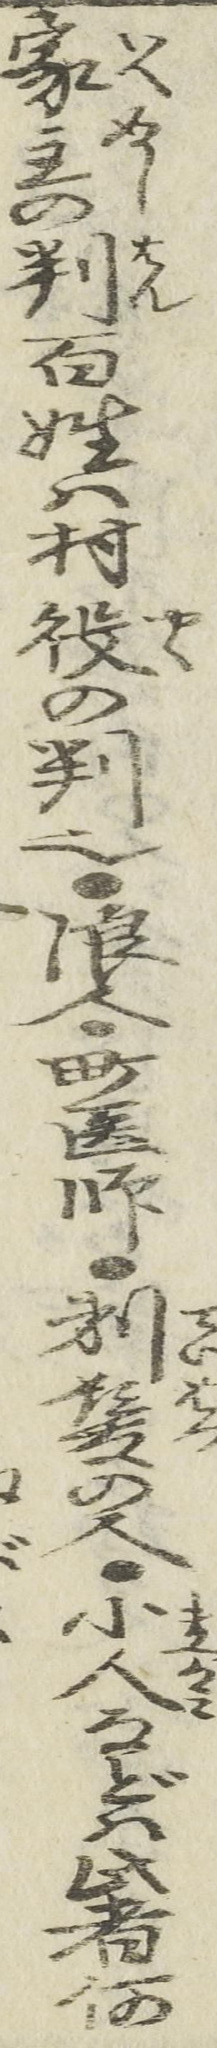家主の判百姓は村役の判也●浪人●町医師●剃髪の人●小人などは此者何
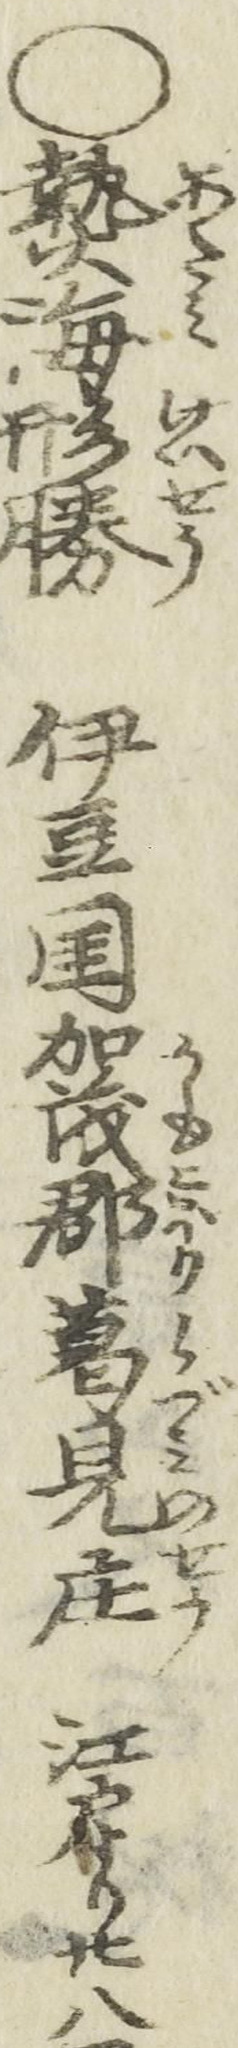○熱海形勝伊豆国加茂郡葛見庄江戸より廿八里
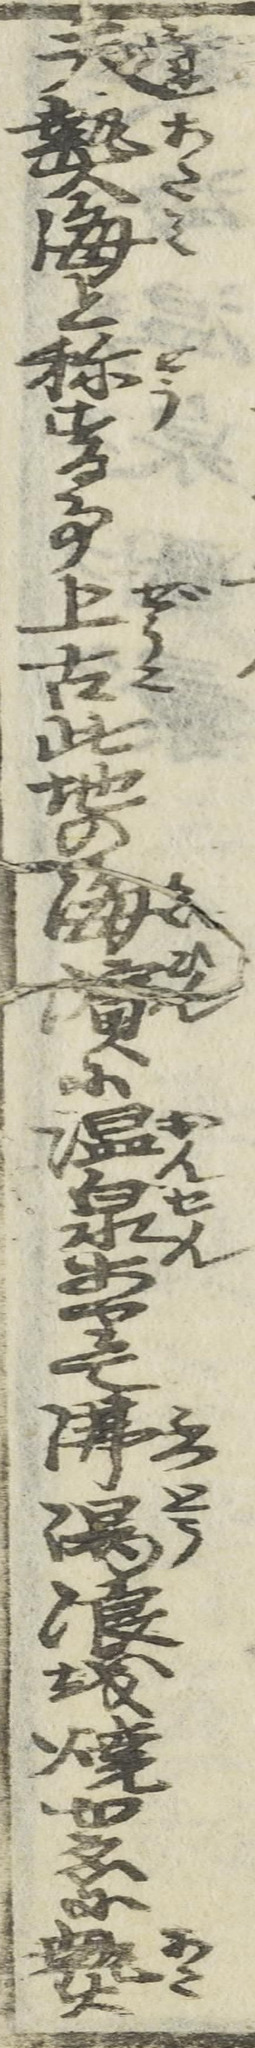夫熱海と称する事上古此地の海濱に温泉ありて沸湯浪を焼ゆえに熱
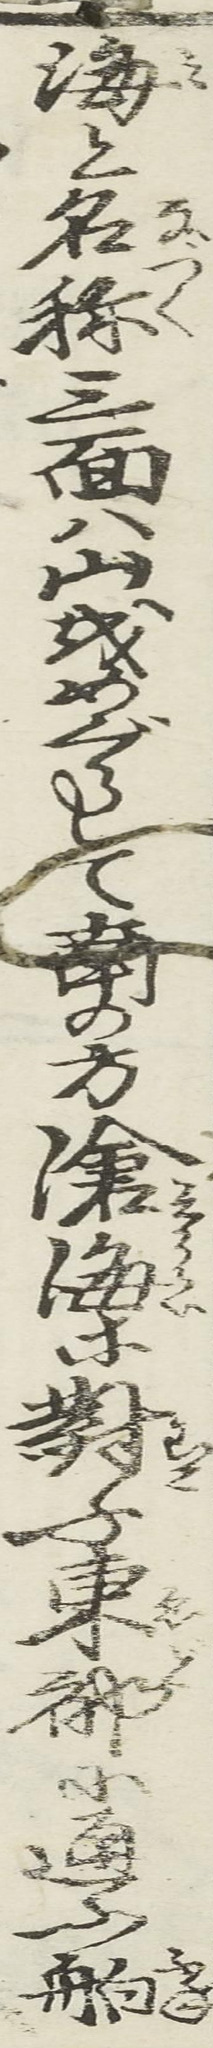海と名称三面は山をめぐらして南の方滄海に對ふ東都に通ふ舶
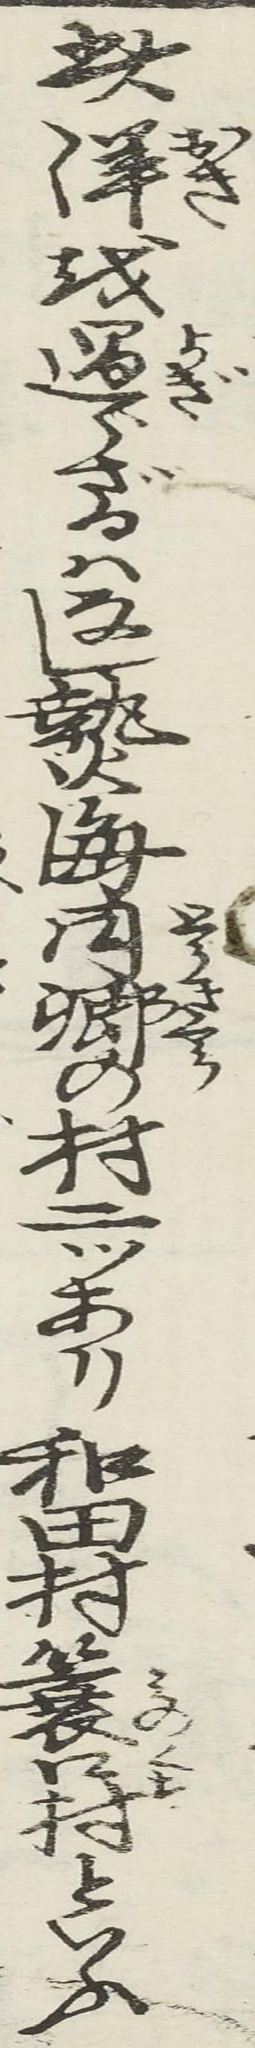此沖を過らざるはなし熱海同郷の村二つあり和田村蓑口村といふ
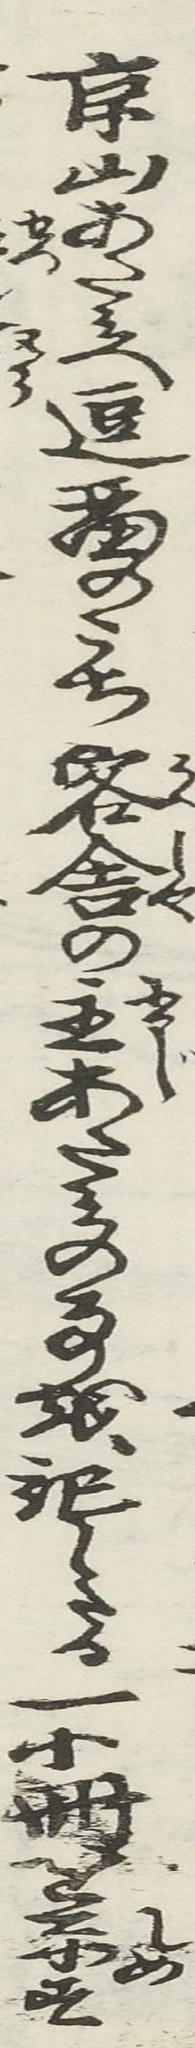京山あたみへ逗留のうち客舎の主あたみの事をしるしたる一小冊を示す
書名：熱海温泉圖彙
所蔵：東京大学地震研究所図書室 Earthquake Research Institute Library, The University of Tokyo, JAPAN
